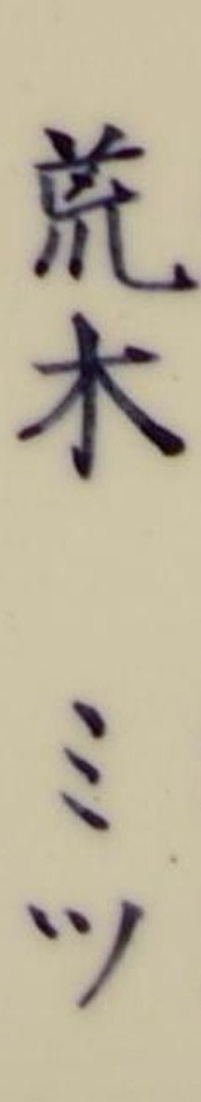荒木ミツ
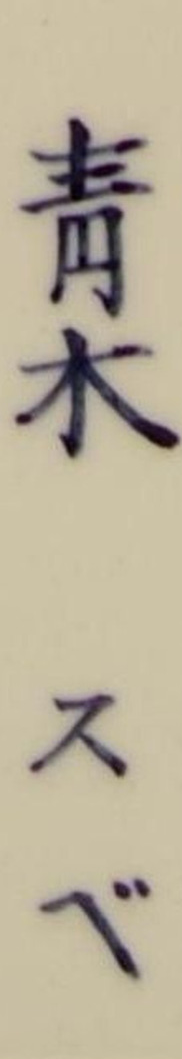青木スベ
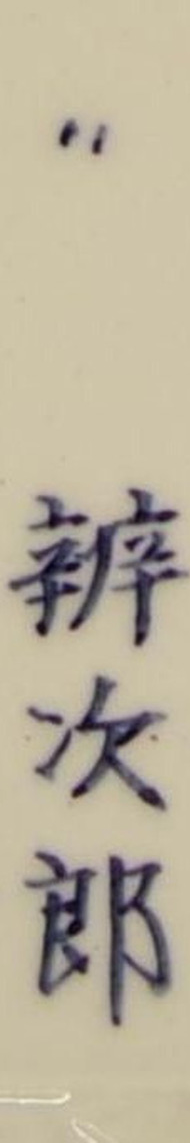辨次郎
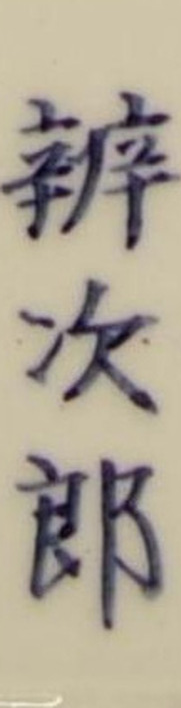辨次郎
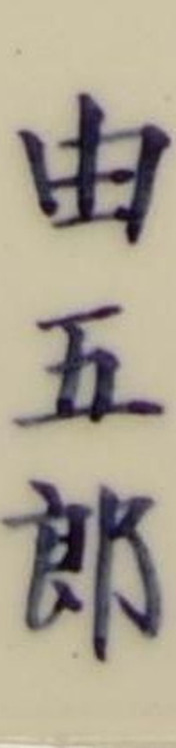由五郎
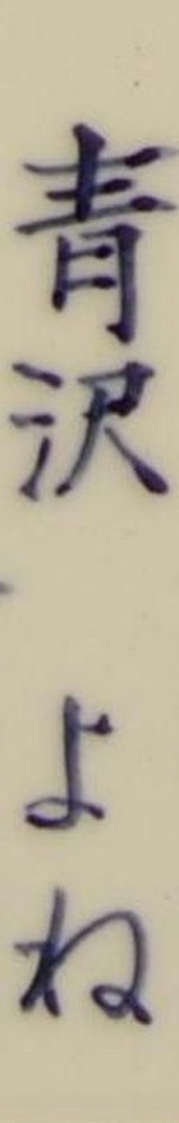青沢よね
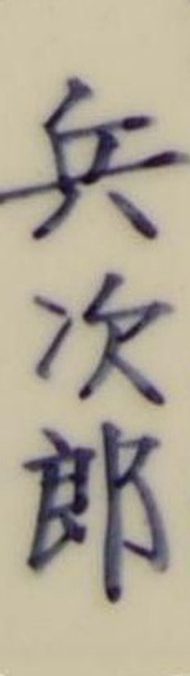兵次郎
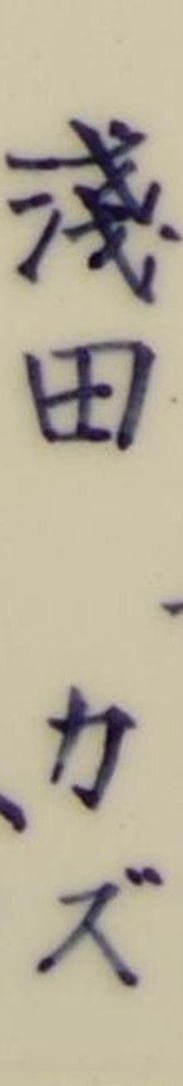浅田カズ
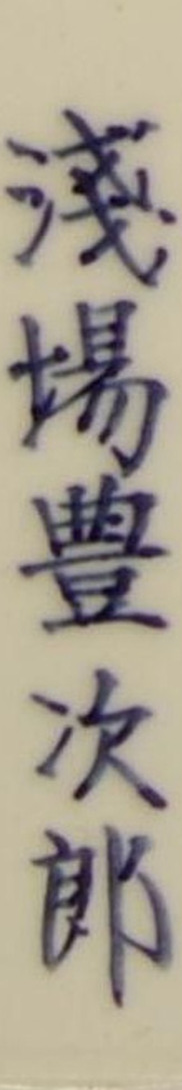浅場豊次郎
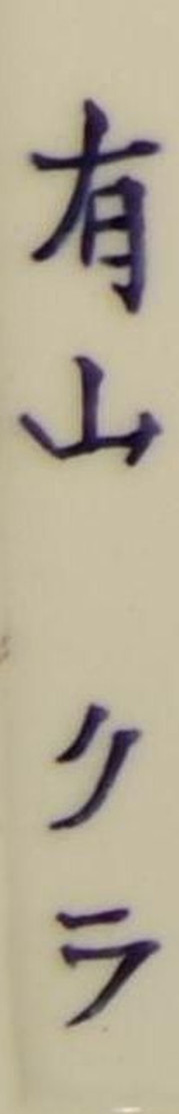有山クラ

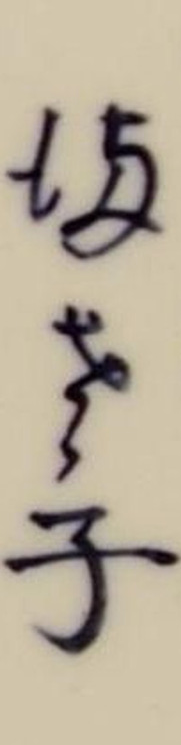まさ子
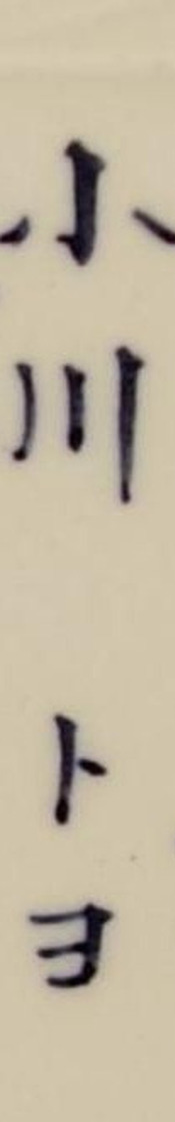小川トヨ
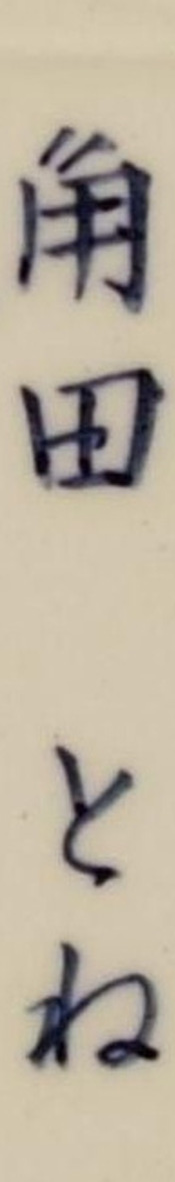角田とね
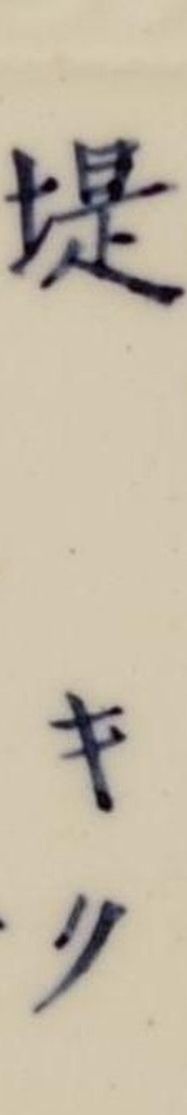堤キク
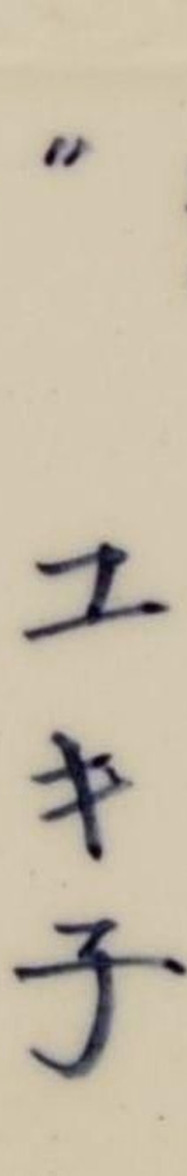ユキ子
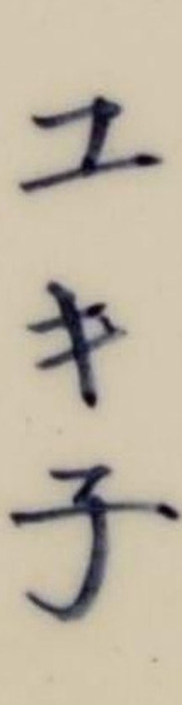ユキ子
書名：E~L
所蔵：高野山金剛峯寺
